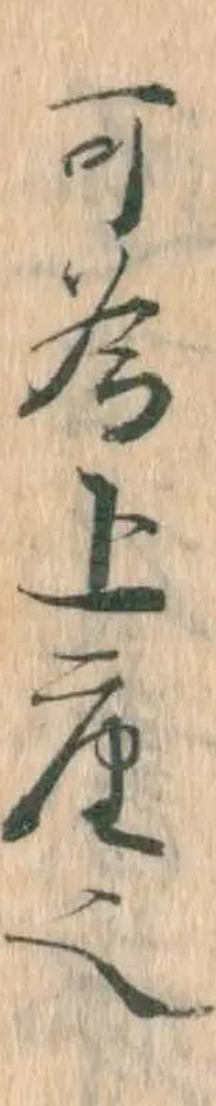可為上座也
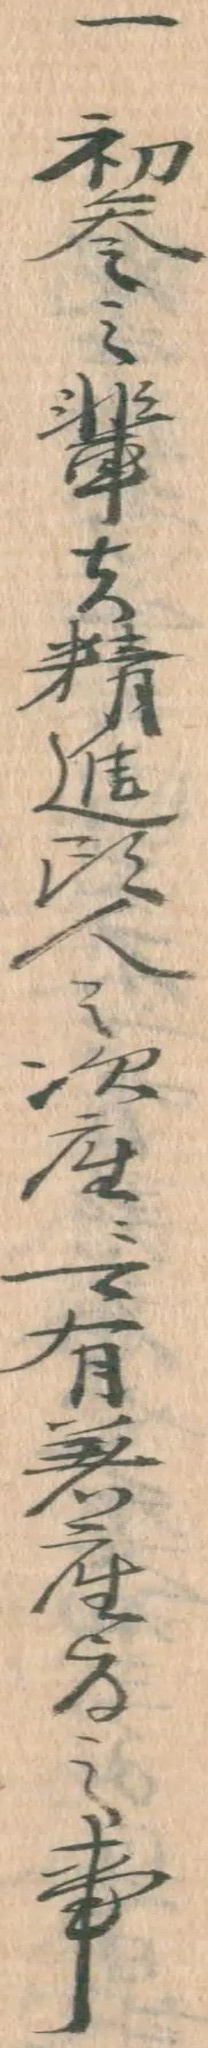一初参之輩は精進頭人之次座に可有着座旨之事
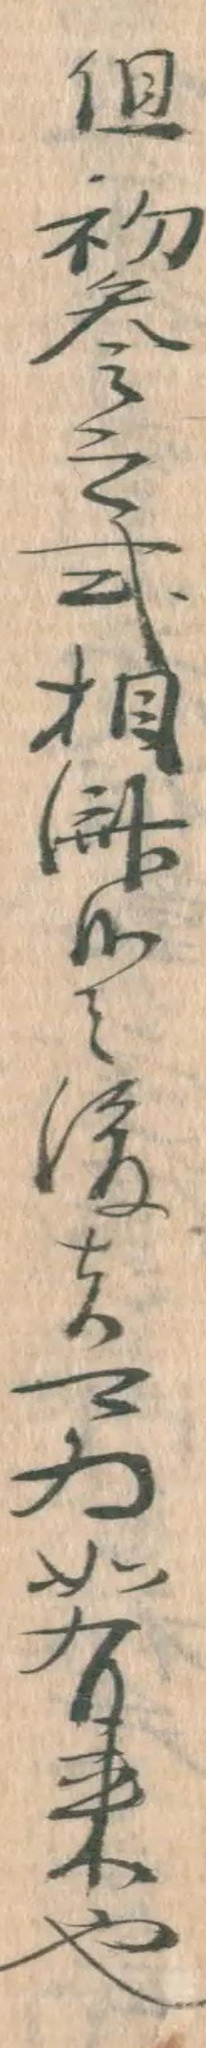但初参之式相済候之後は可為如有来也
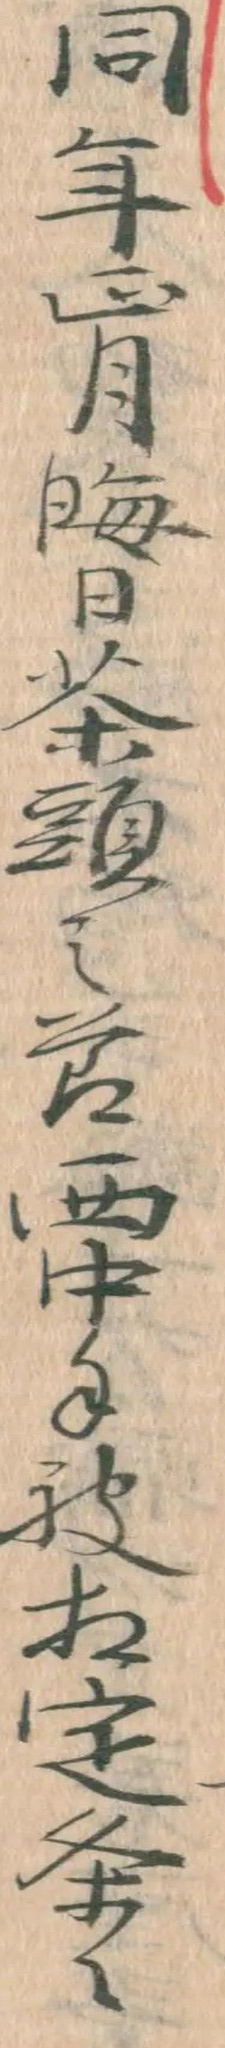同年正月晦日茶頭之節西中手被相定条々
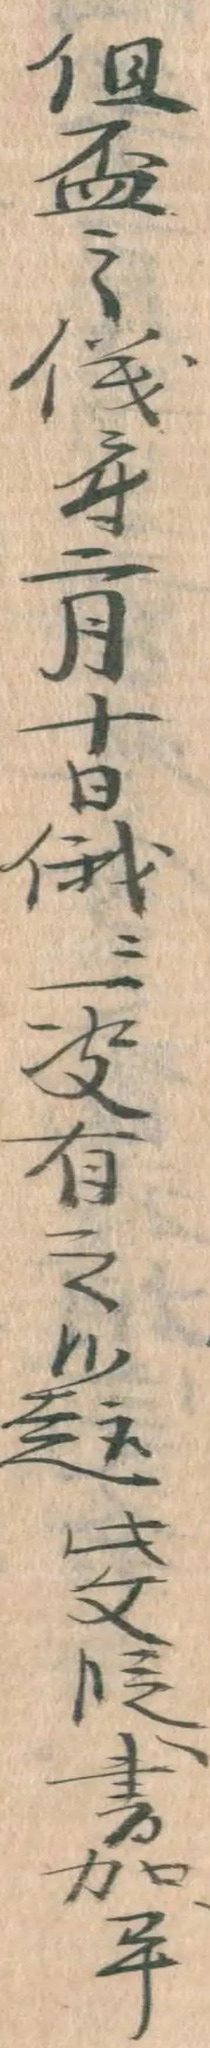但盃之儀ニ付二月十日俄ニ一決有之候趣此文段書加ヘ畢
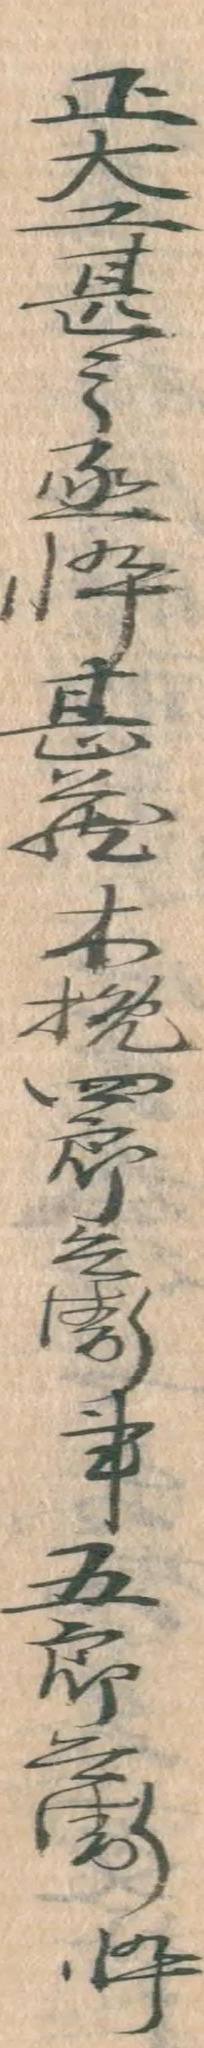一正大工甚之丞忰甚蔵木挽四郎兵衛事五郎兵衛倅
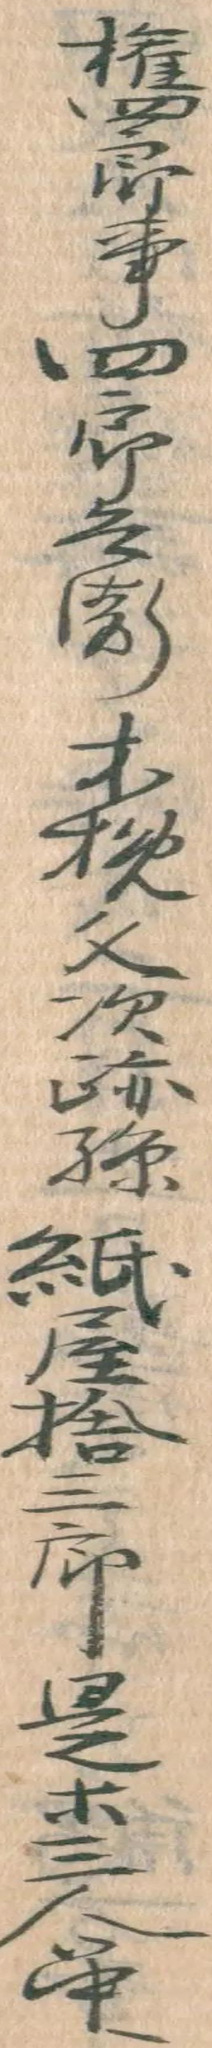権四郎事四郎兵衛木挽文次跡孫紙屋捨三郎是等三人御中ヘ
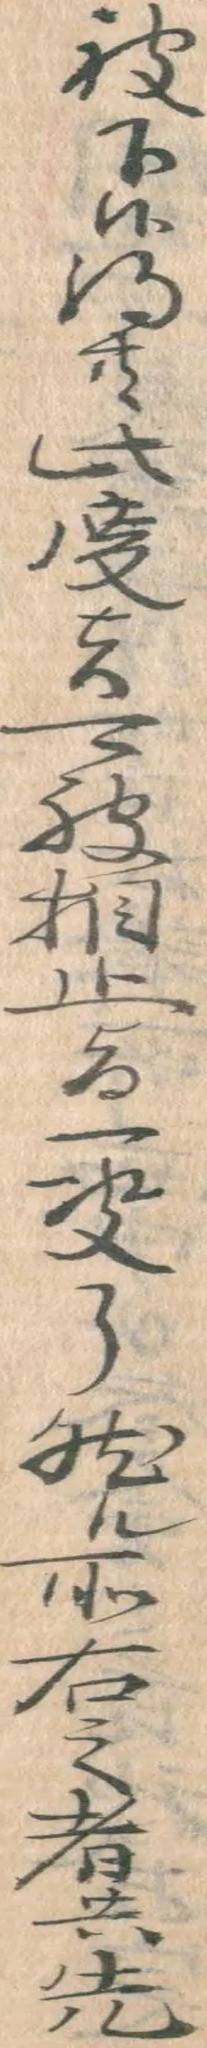被下候得共此度は可被相止旨一決了然ル所右之者共先
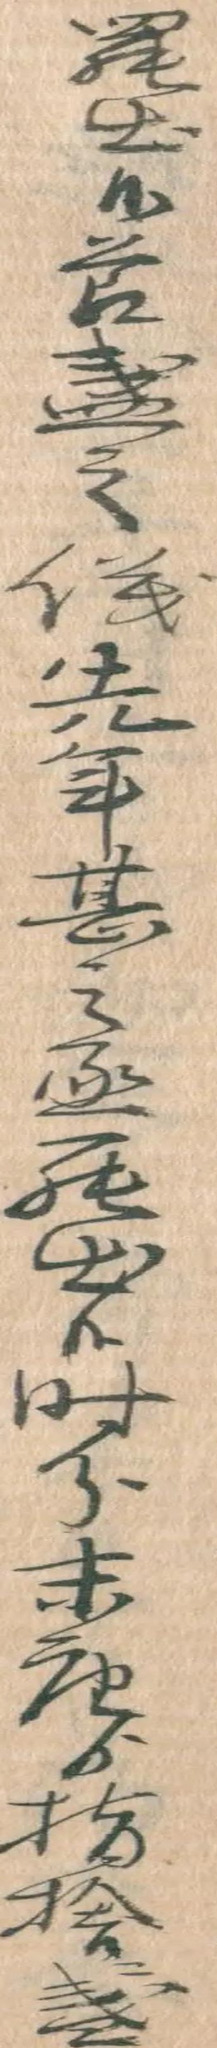罷出候節盞盛之儀先年甚之丞罷出る時分末座ゟ指捨ニ盞
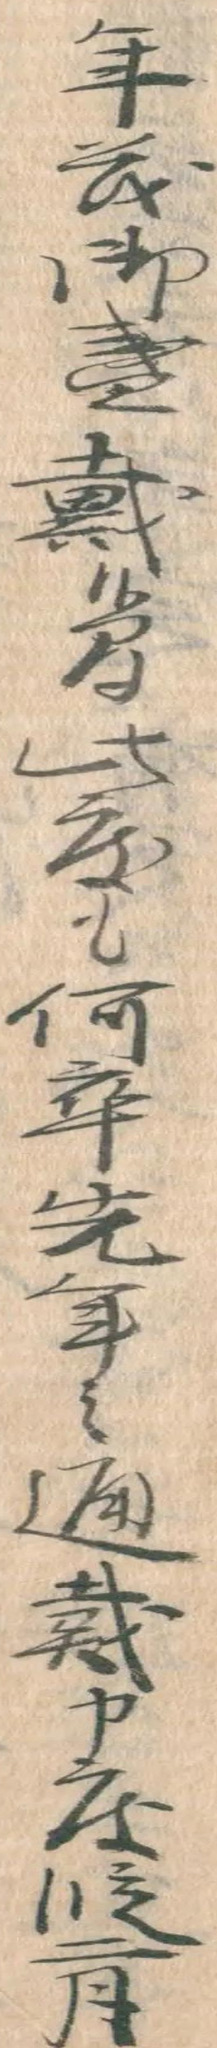年も御盞戴候間此度も何卒先年之通裁申度段二月
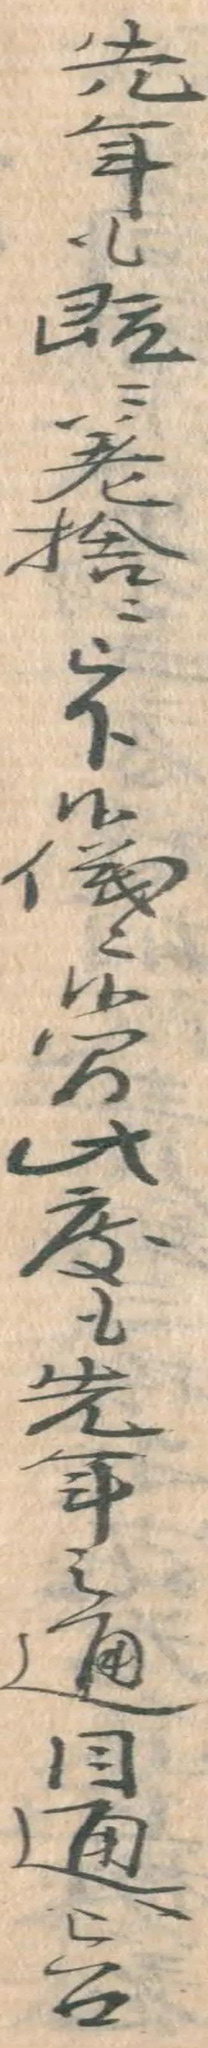先年も既ニ差捨ニ被下候儀ニ候間此度も先年之通目通へ被召
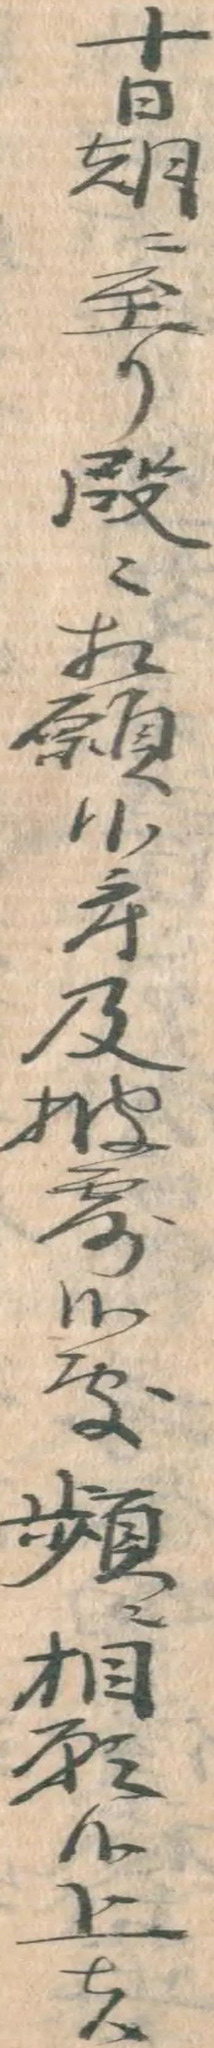十日朝ニ至り段〻相願候ニ付及披露候處頻ニ相願侯上は
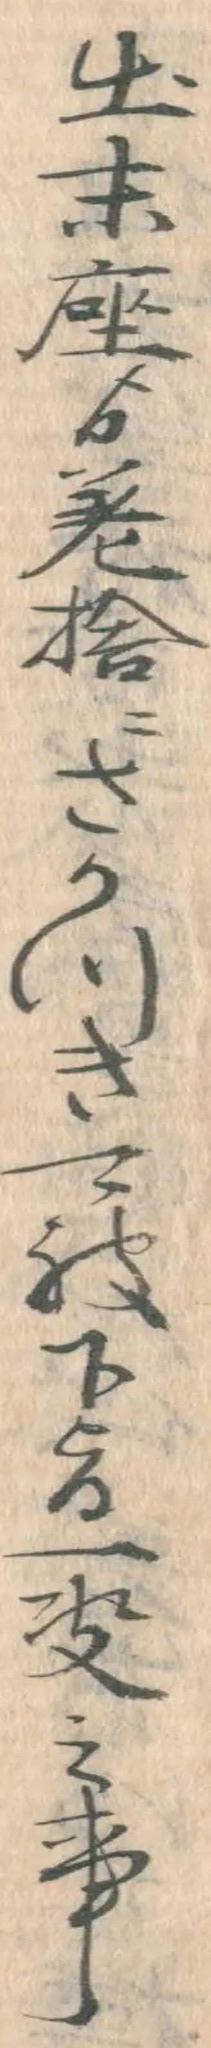出末座ゟ差捨ニさかつき可被下旨一決之事

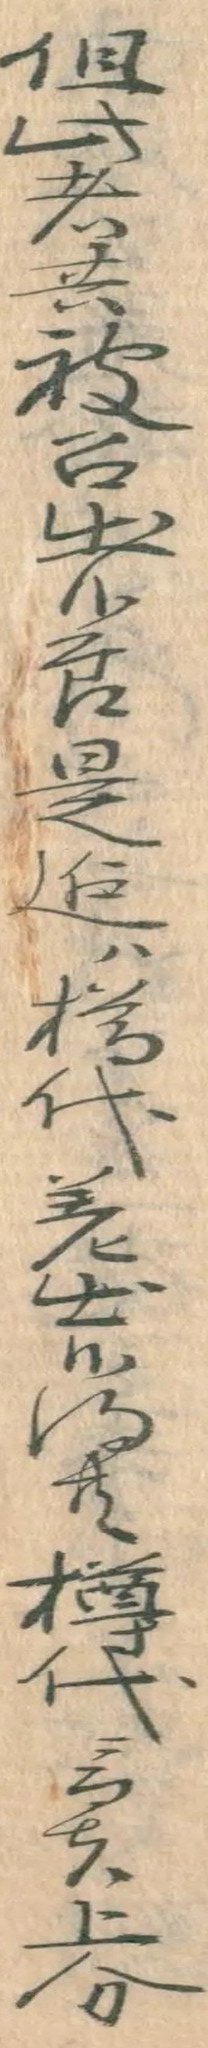但此者共被召出候節是迄ハ樽代差出候得共樽代ニ而は上分
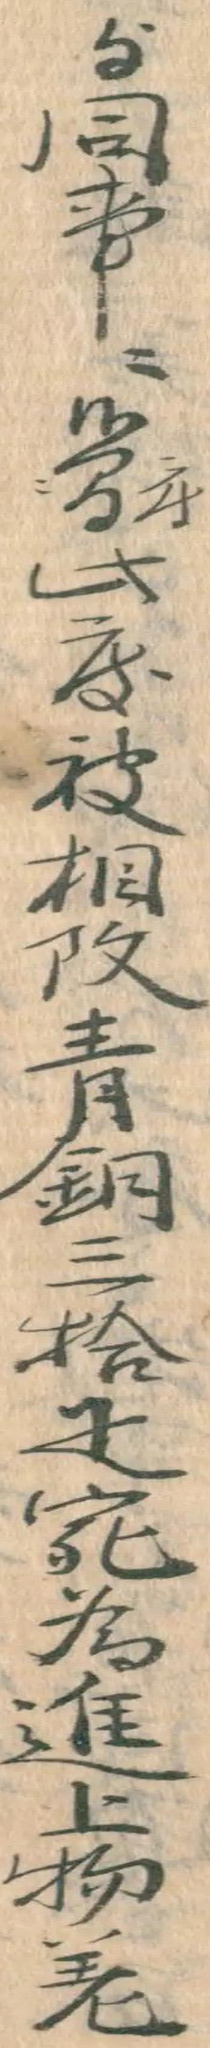と同事ニ候ニ付此度被改青銅三拾疋宛為進上物差
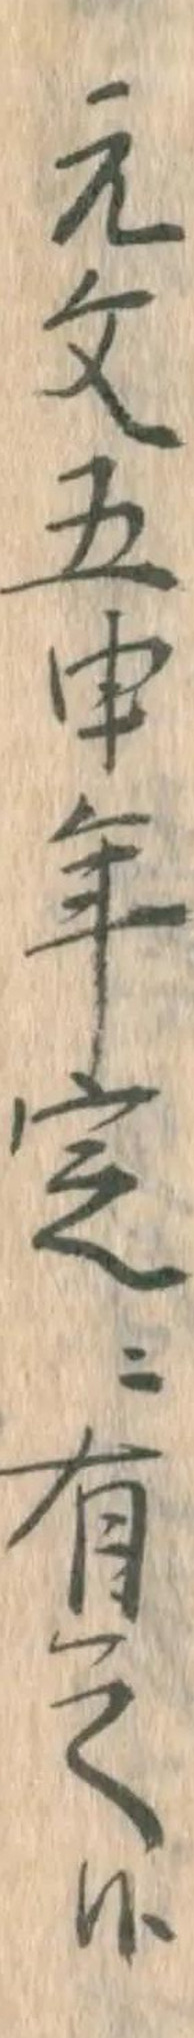元文五申年定ニ有之候
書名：賀茂社記録. 第29冊
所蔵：国立国会図書館 National Diet Library, JAPAN
